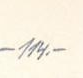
114
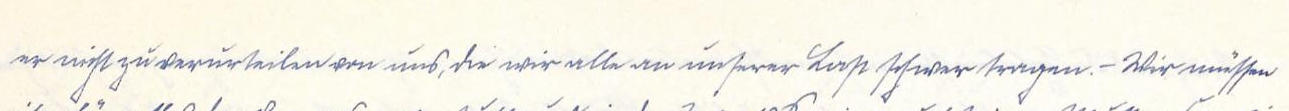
er nicht zu verurteilen von uns, die wir alle an unserer Last schwer tragen. Wir müssen
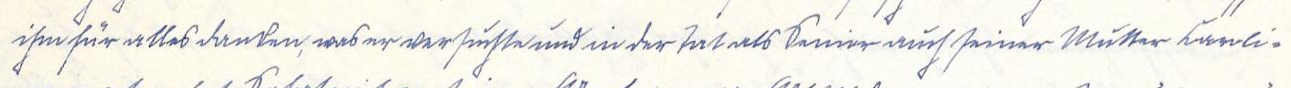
ihm für alles danken, was er versuchte und in der Tat als Senior auch seiner Mutter Caroli-
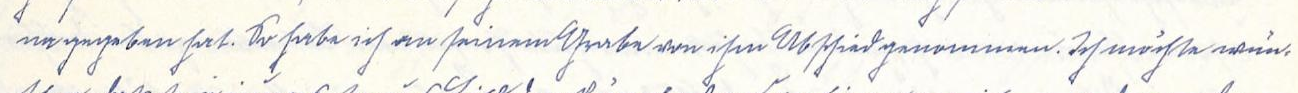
na gegeben hat. So habe ich an seinem Grabe von ihm Abschied genommen. Ich machte wün
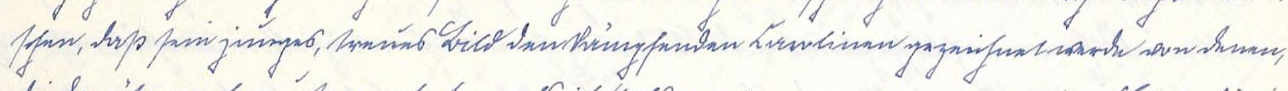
schen, dass sein junges, treues Bild den kämpfenden Caroline gezeichnet werde von denen,
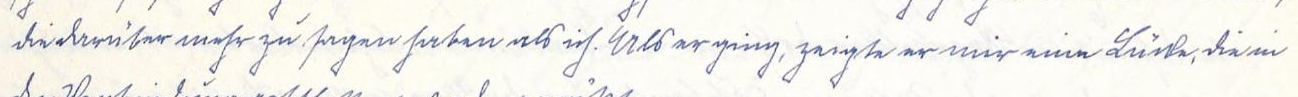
die darüber mehr zu sagen haben als ich. Als er ging, zeigte er mir eine Lücke, die
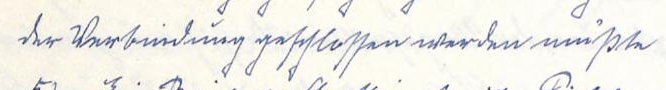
der Verbindung geschlossen werden müsste...
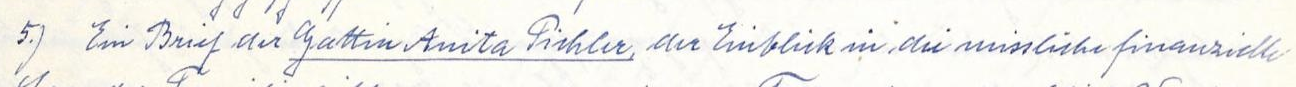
5.) Ein Brief der Gattin Anita Pichler, der Einblick in die missliche finanzielle
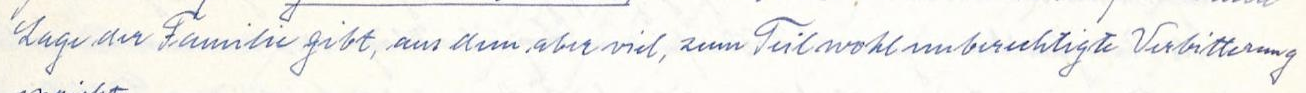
Lage der Familie gibt, aus dem aber viel, zum Teil wohl unberechtigte Verbitterung
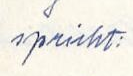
spricht:
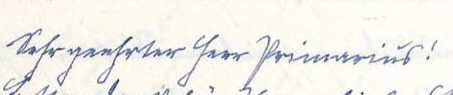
Sehr geehrter Herr Primarius!
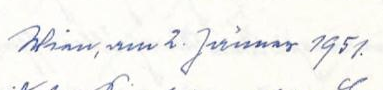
Wien, am 2. Jänner 1951
